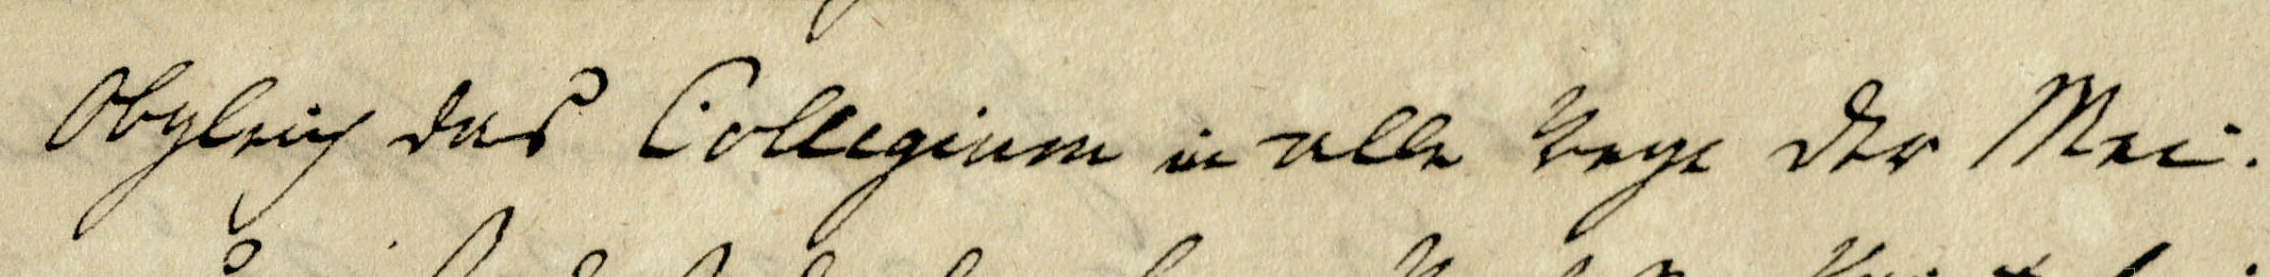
Obgleich das Collegium in alle Wege der Mei¬
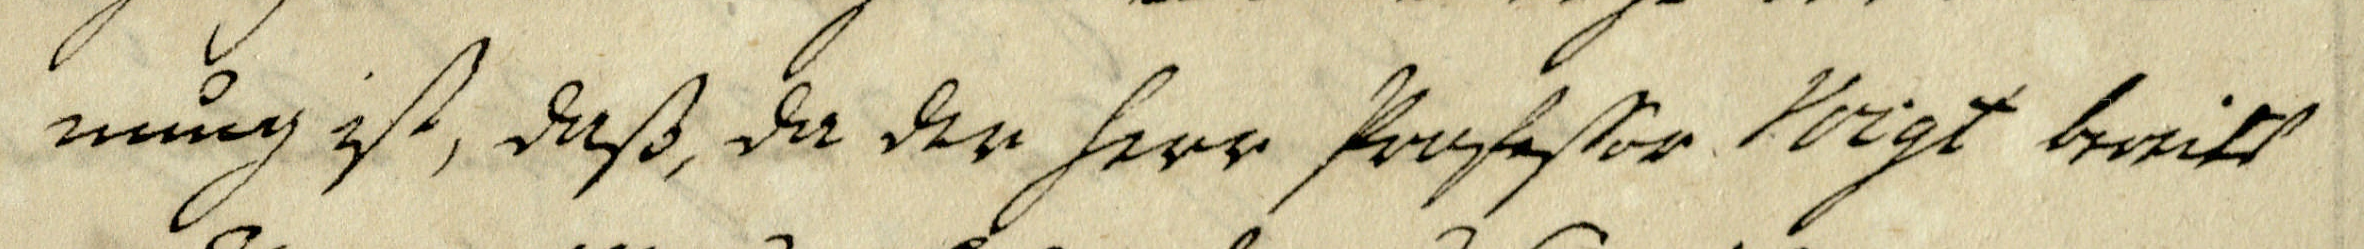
nung ist, daß, da der Herr Professor Voigt bereits
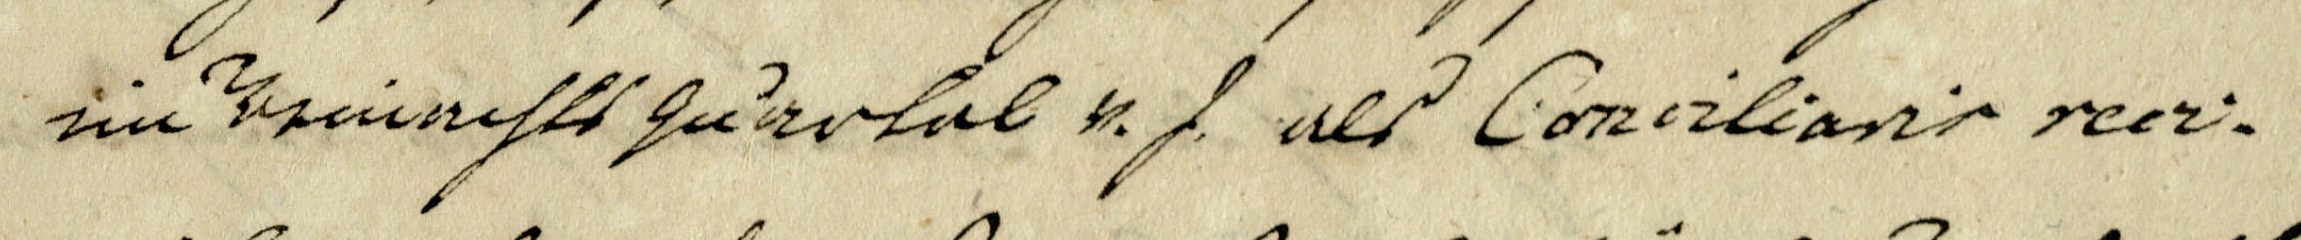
im Weinachts Quartal v. J. als Conciliaris reci¬
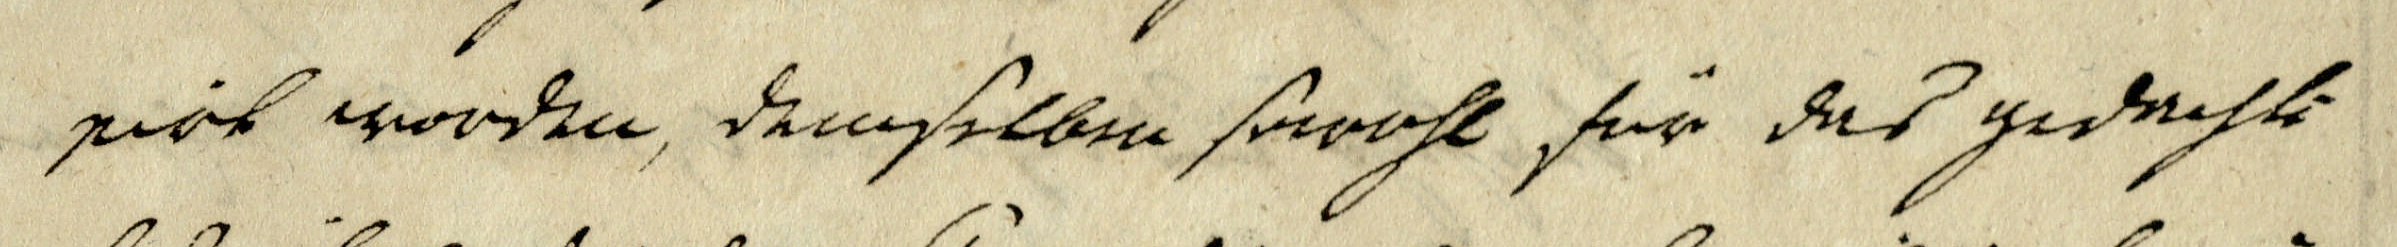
pirt worden, demselben sowohl für das gedachte
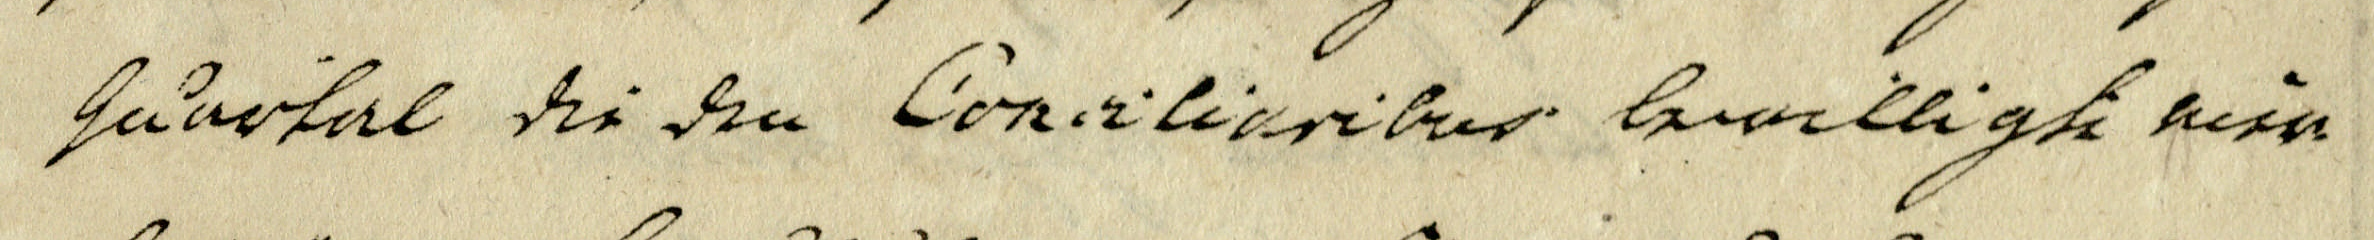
Quartal die den Conciliaribus bewilligte vier
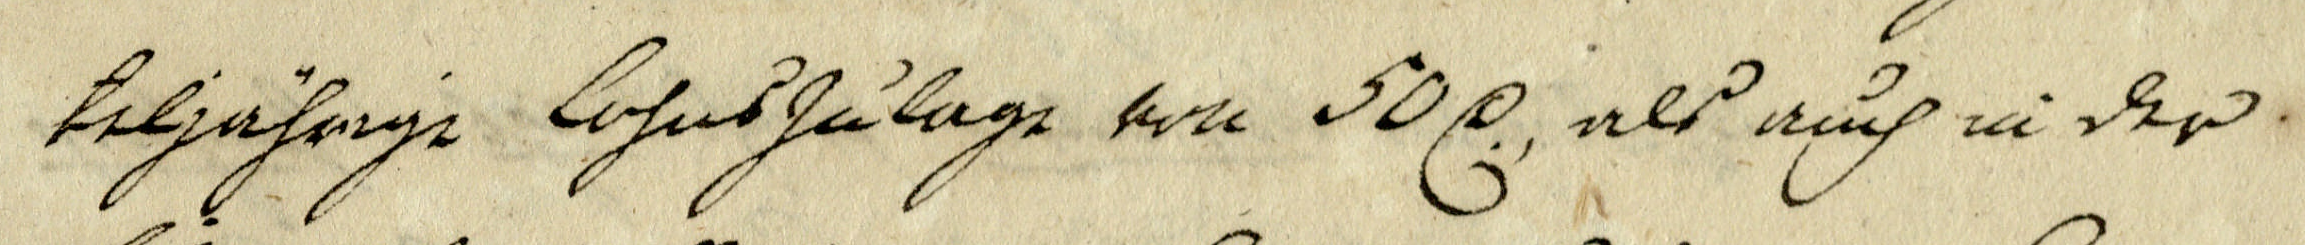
teljährige Lohnszulage von 50 l, als auch in der
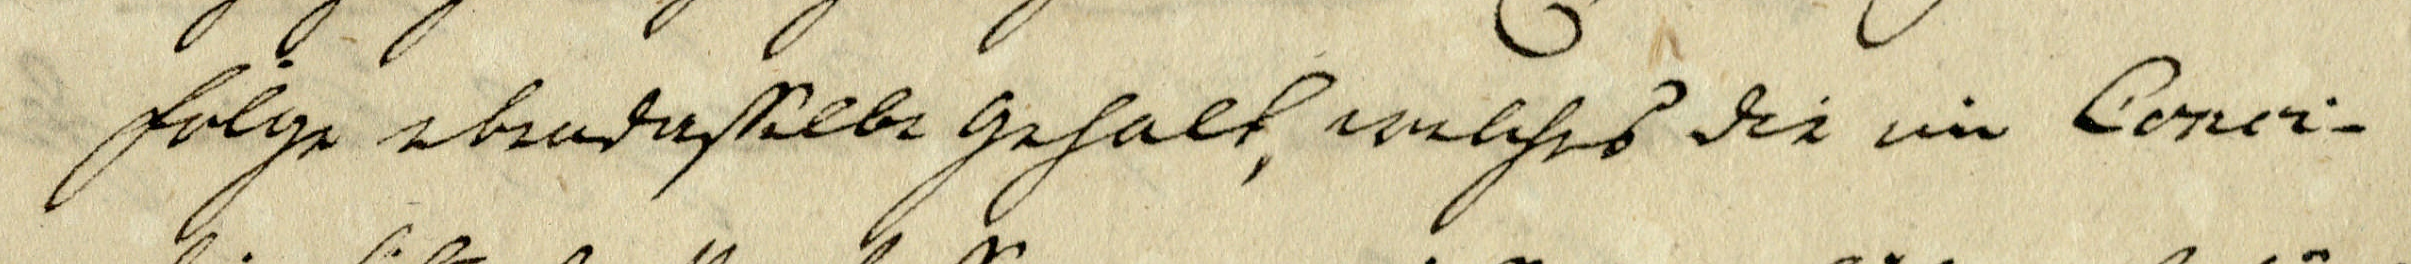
Folge ebendasselbe Gehalt, welches die im Conci¬
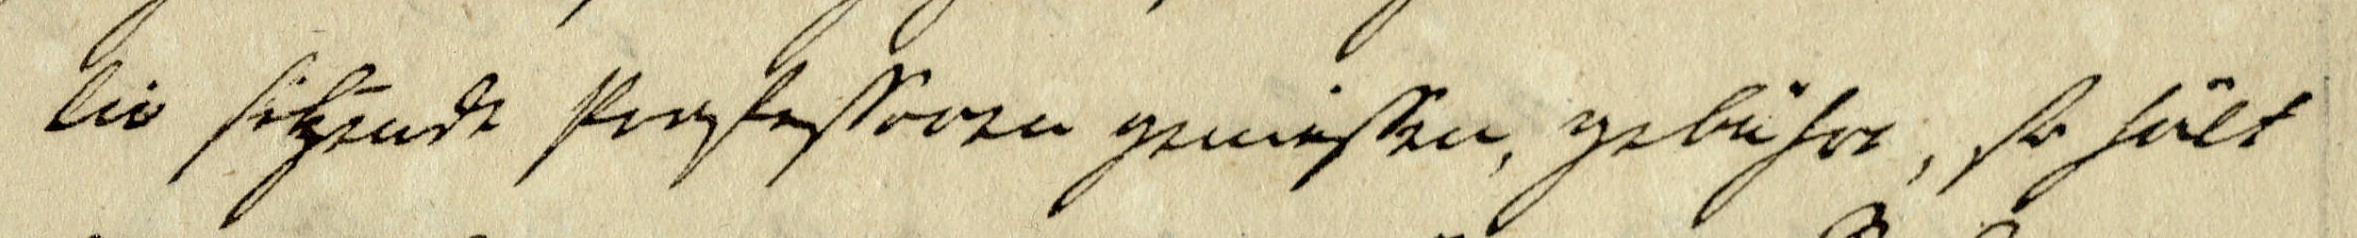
lio sitzende Professoren geniessen, gebühre, so hält
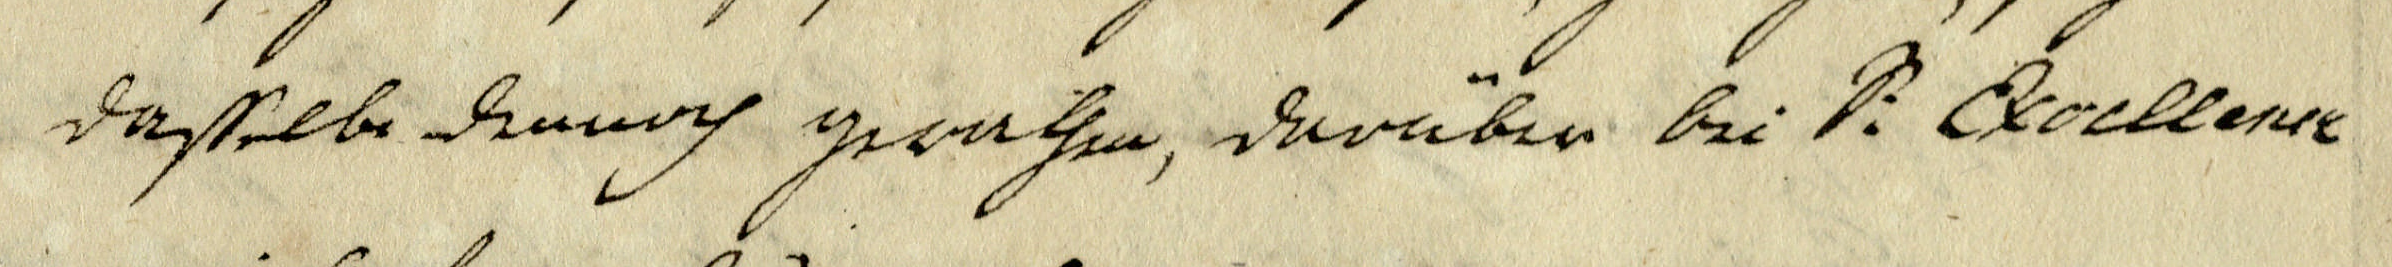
dasselbe dennoch gerathen, darüber bei Sr. Excellence
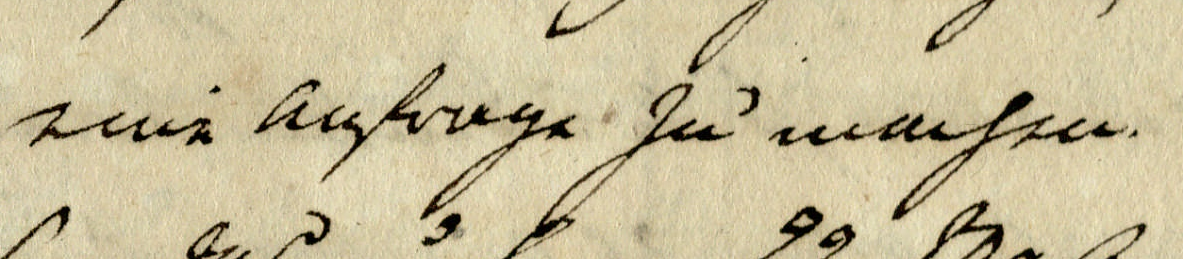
eine Anfrage zu machen.
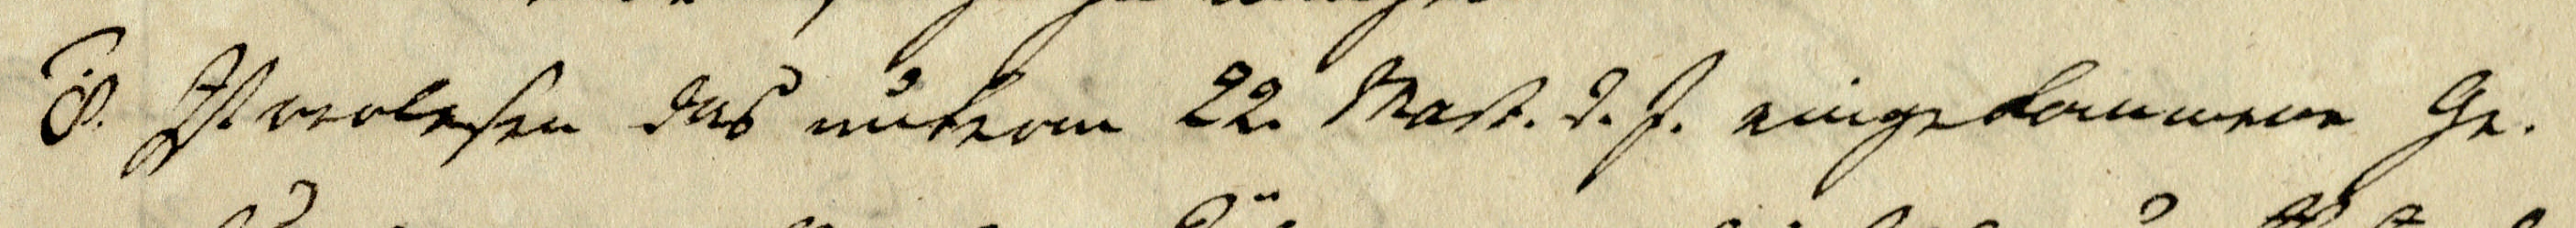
8. Ist verlesen das unterm 22. Mart. d. J. eingekommene Ge¬
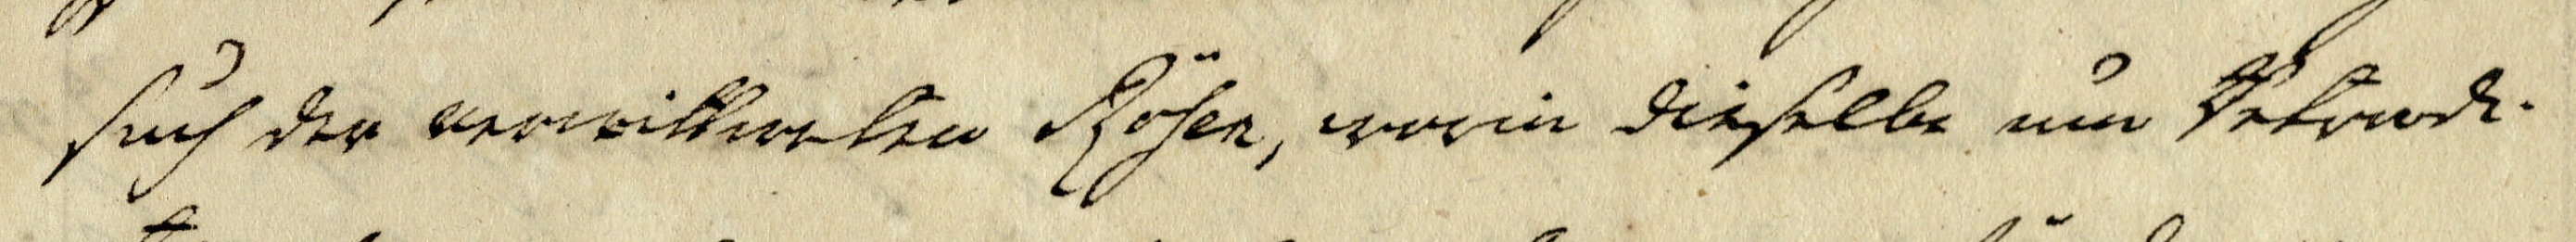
such der verwittweten Rösen, worin dieselbe um Retradi¬
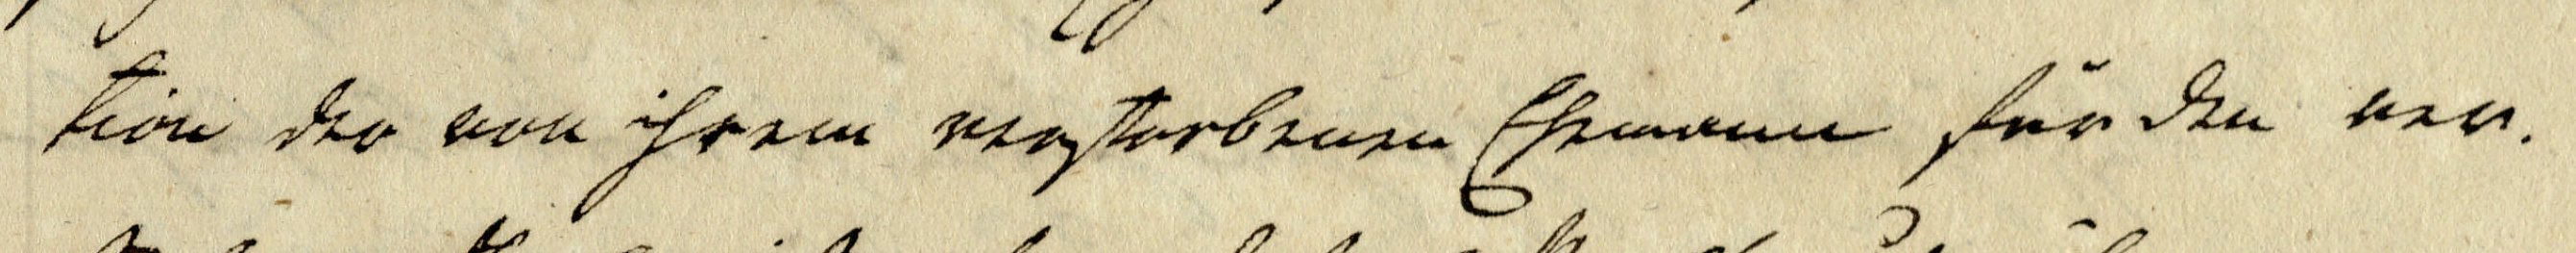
tion der von ihrem verstorbenen Ehemann für den ver¬
